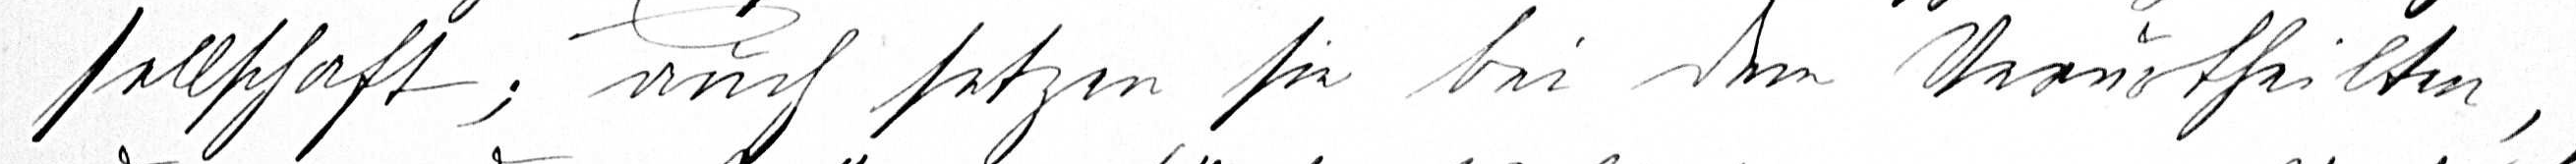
sellschaft; auch setzen sie bei dem Verurtheilten,
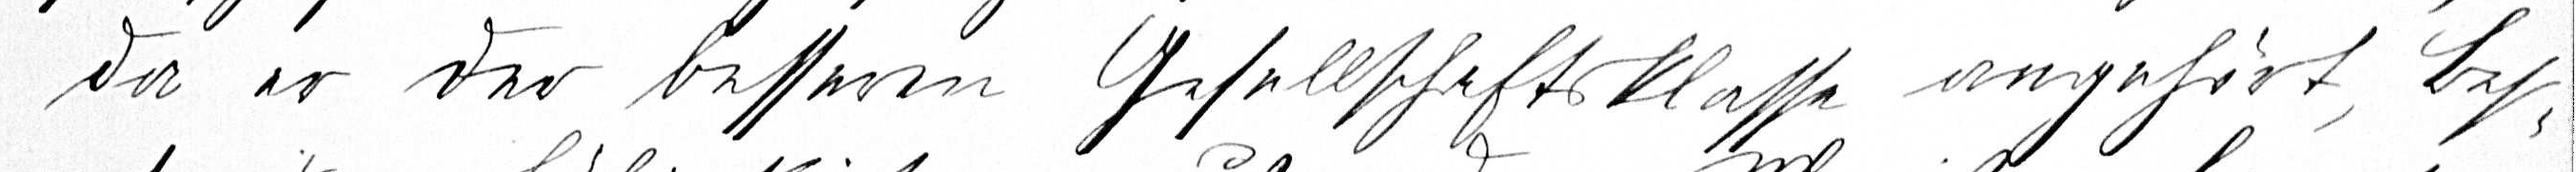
da er der besseren Gesellschaftsklasse angehört, Be¬
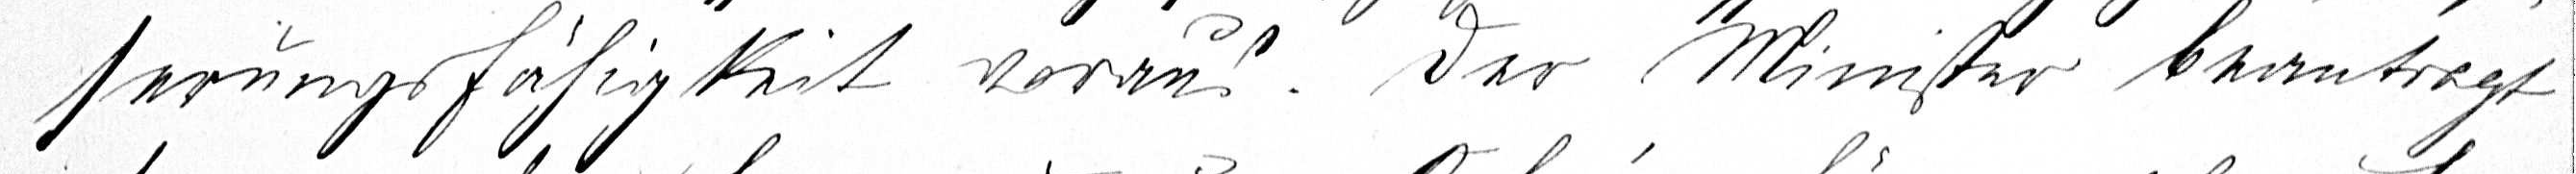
serungsfähigkeit voraus. Der Minister beantragt
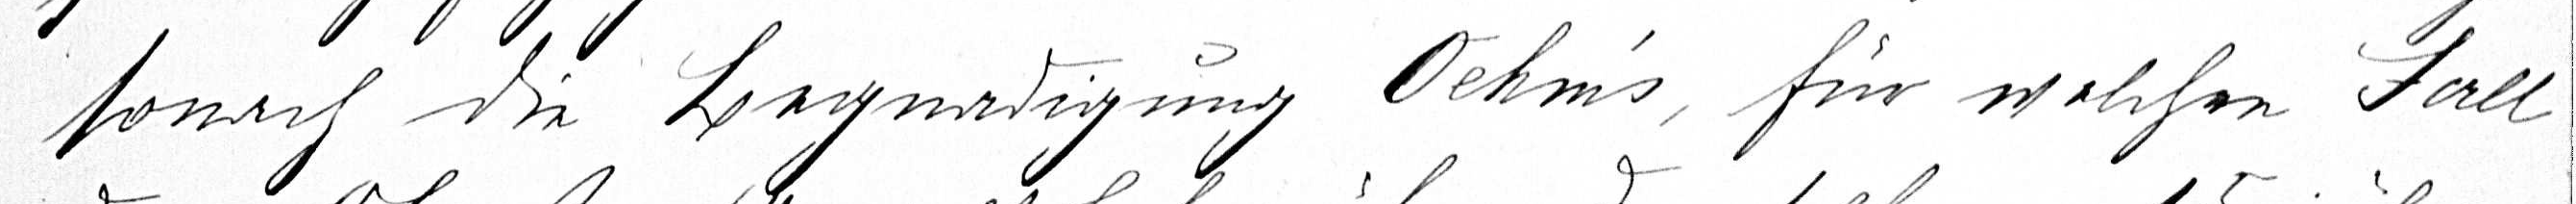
sonach die Begnadigung Oehm's, für welchen Fall
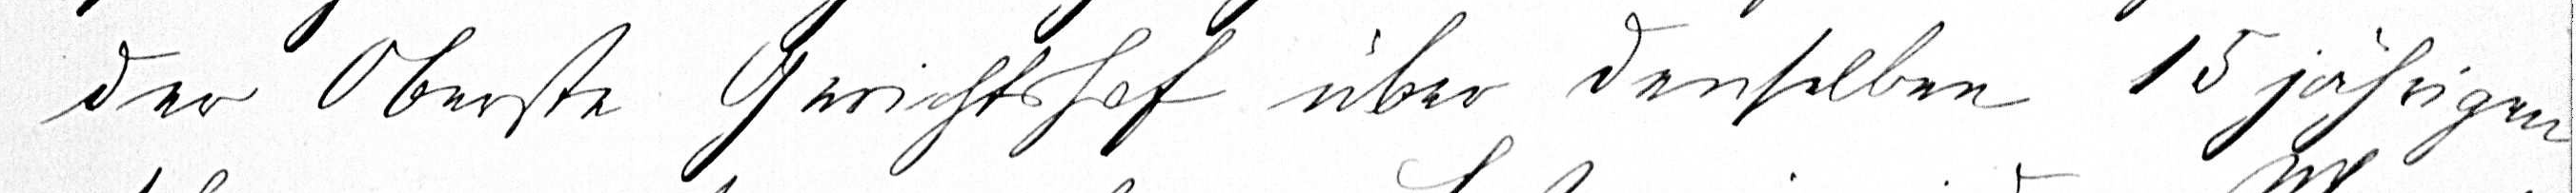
der Oberste Gerichtshof über denselben 15jährigen
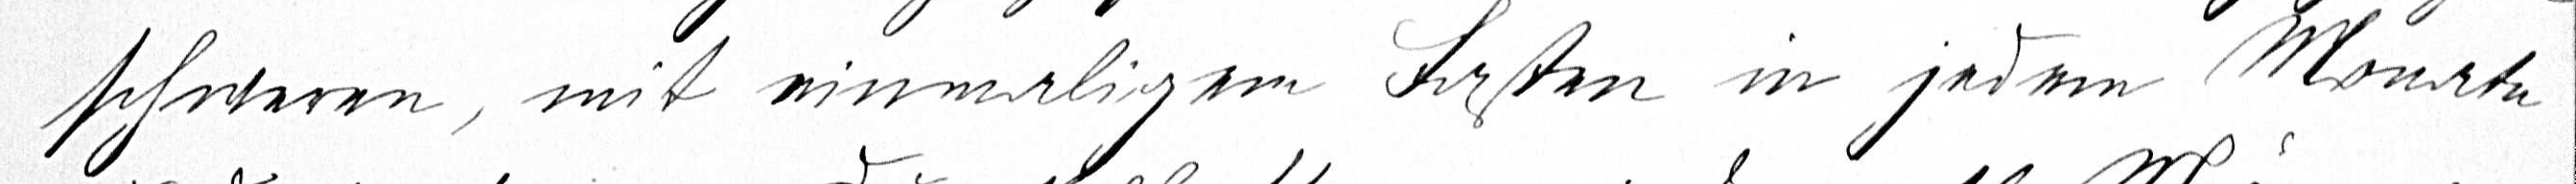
schweren, mit einmaligem Fasten in jedem Monate
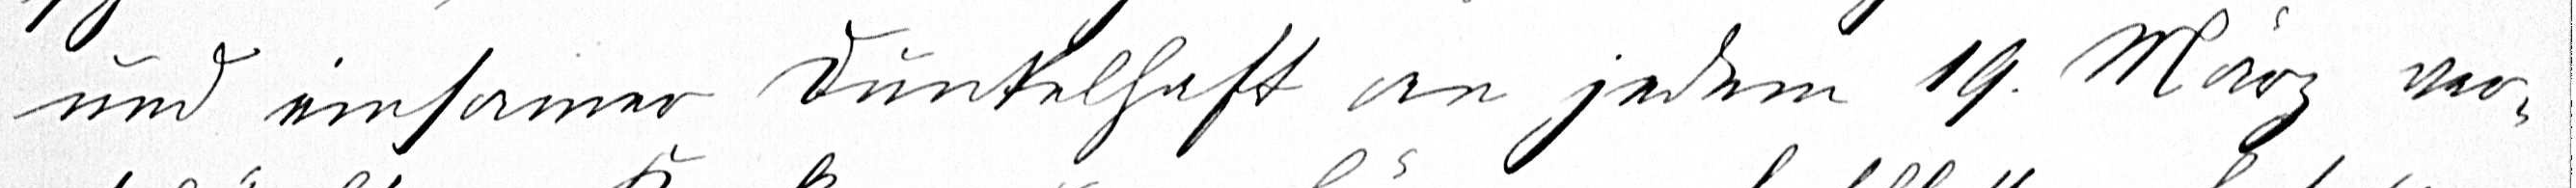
und einsamer Dünkelhaft an jedem 19. März ver¬
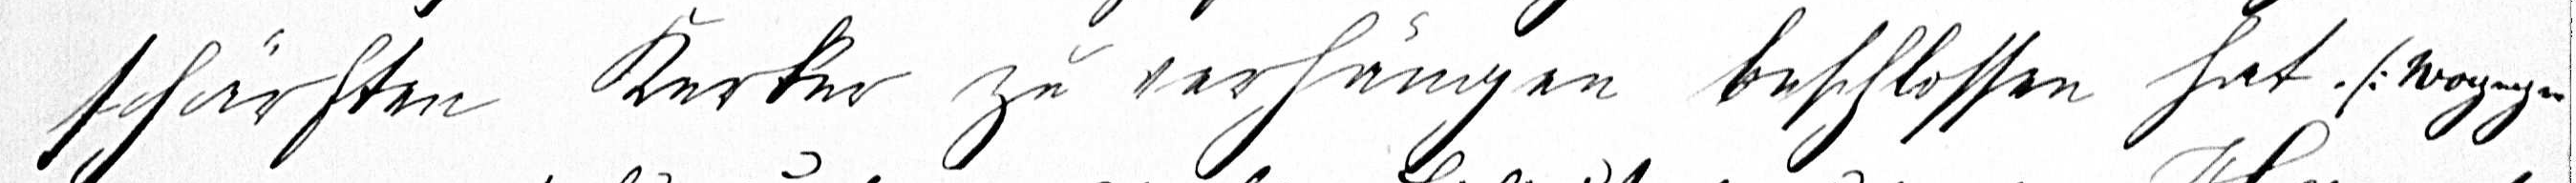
schärften Kerker zu verhängen beschlossen hat. /: Wogegen
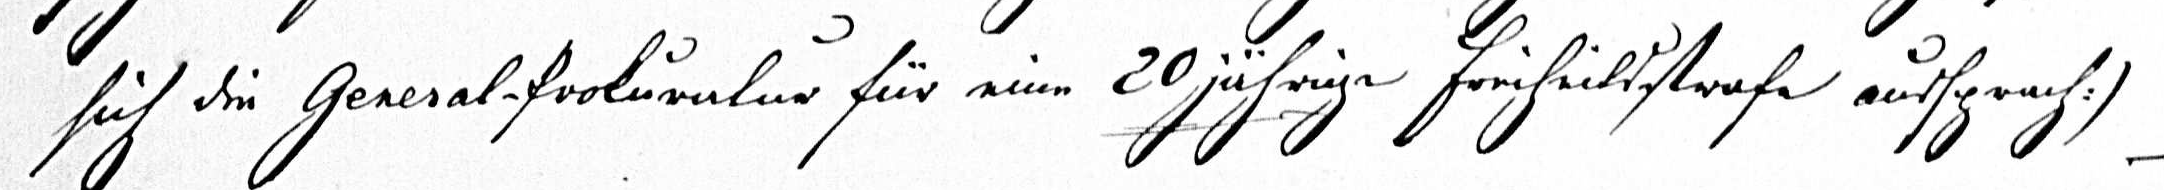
sich die General-Prokuratur für eine 20jährige Freiheitsstrafe aussprach:)
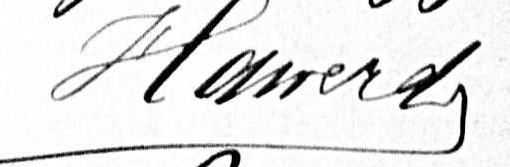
Hawert
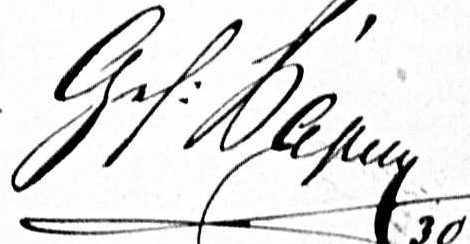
Geh. xx
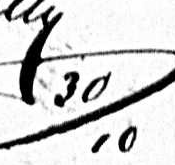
30
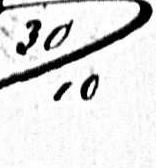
10
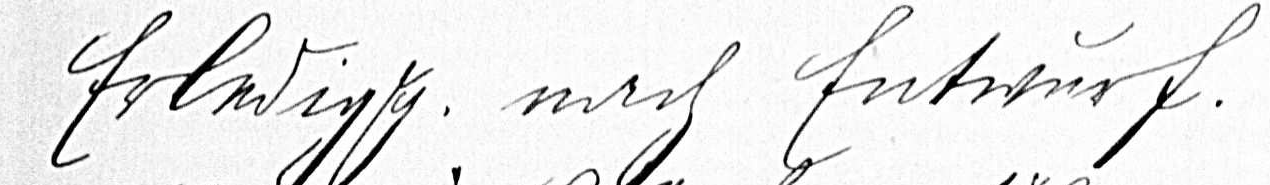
Erledigg. nach Entwurf.
